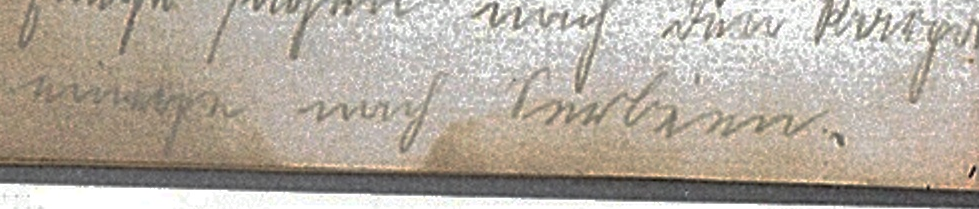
einige nach Serbien.
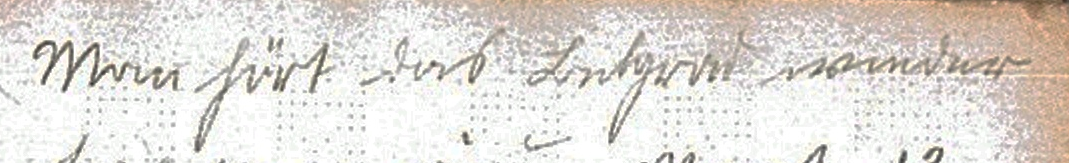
Man hört das Belgrad wieder
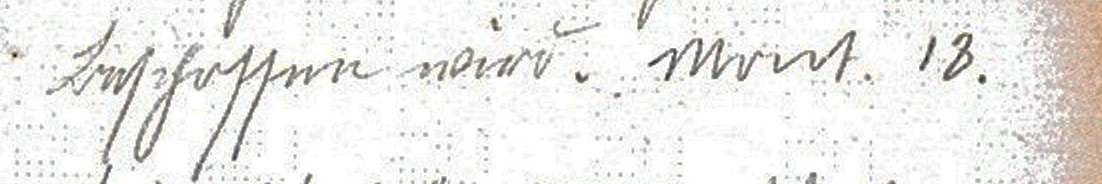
angegriffen wird. Mont 18.
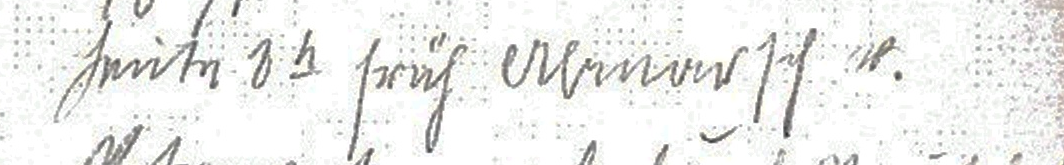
Heute 8h früh Abmarsch r.
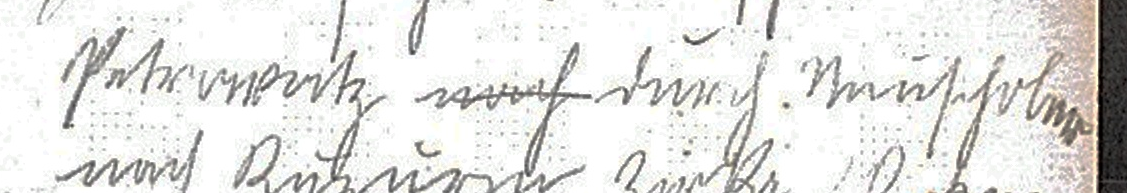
Petrowatz durch Neuscholm
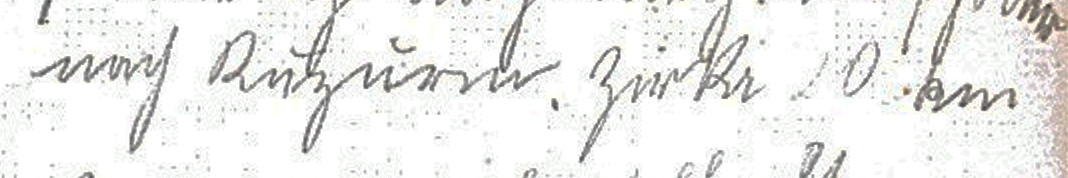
nach Kuzuvin. Zirka 20 km
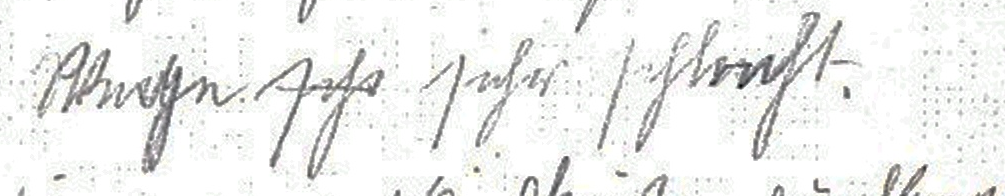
Wege sehr schlecht.
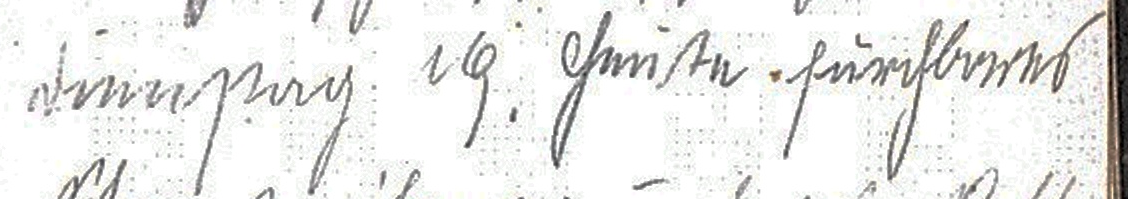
Dienstag 19. Heute furchtbares
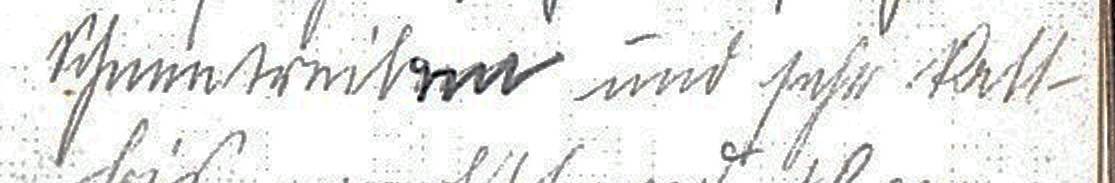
Schneetreiben und sehr kalt
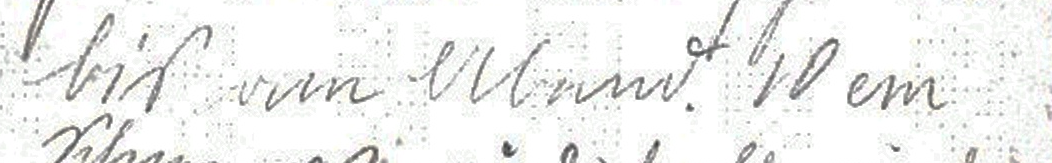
bis am Abend. 10 cm
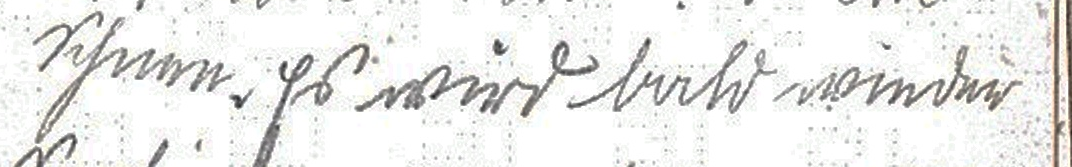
Schnee. Es wird bald wieder
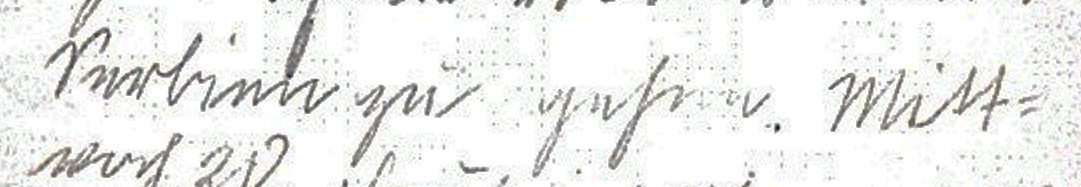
Serbien zu gehen. Mitt-
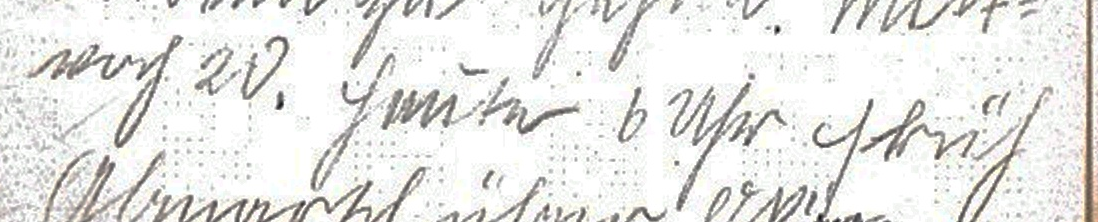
woch 20. Heute 6 Uhr früh
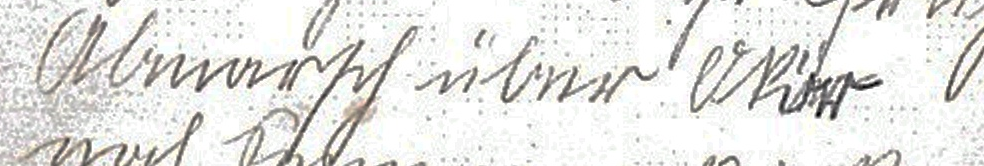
Abmarsch über Vkir
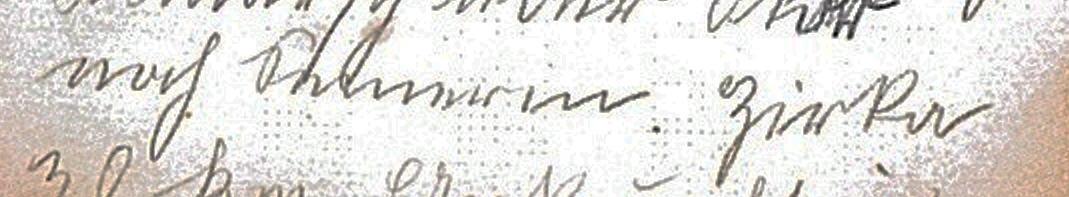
nach Sxxxrin.Zirka
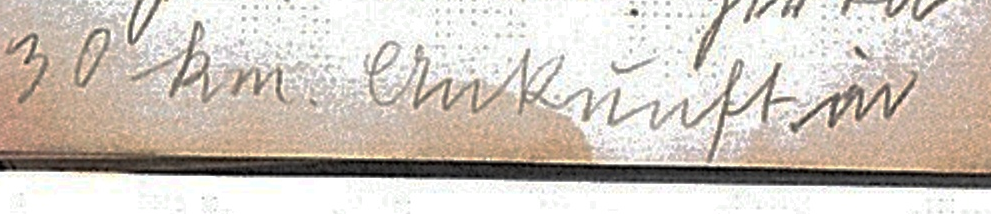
30 km. Ankunft in
